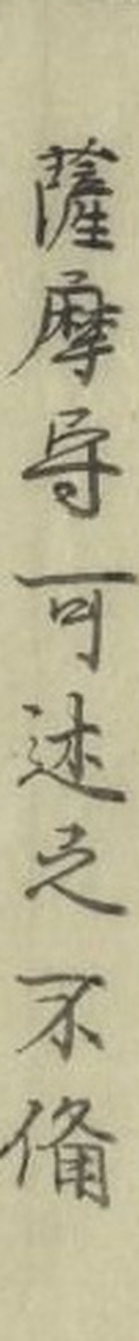薩摩守可述之不備
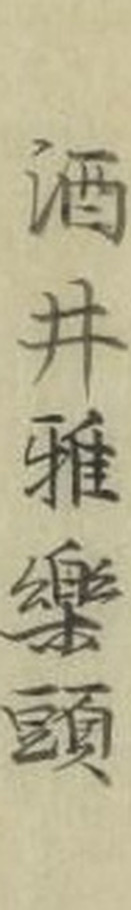酒井雅楽頭
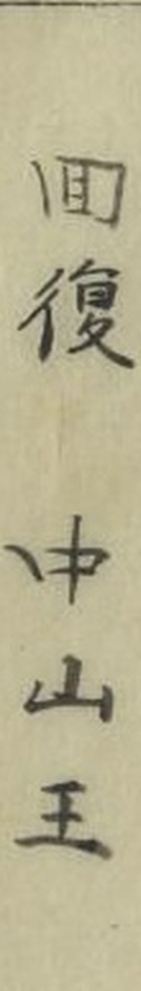回復中山王

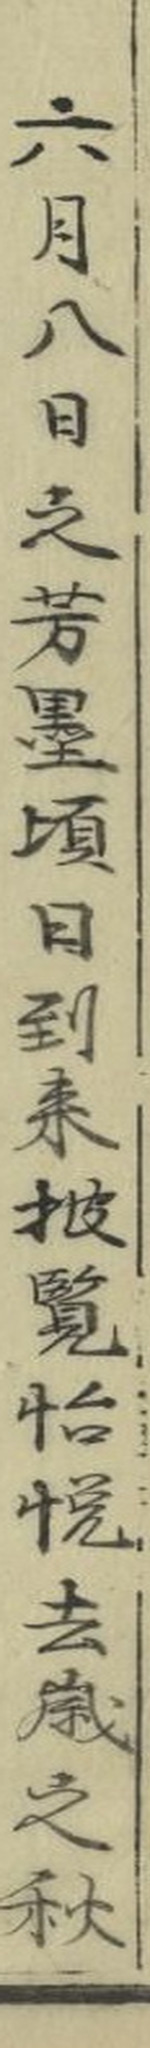六月八日之芳墨頃日到来披覧怡悦去歳之秋
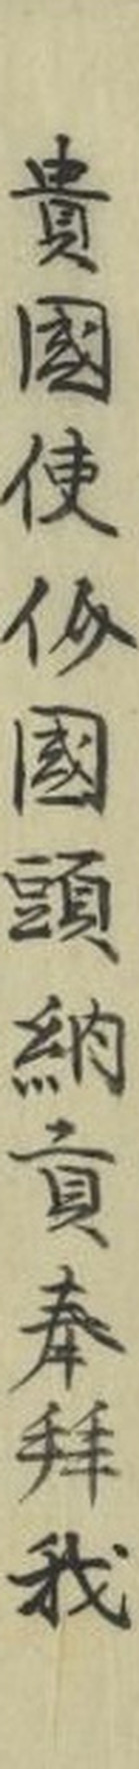貴国使价国頭納貢奉拝我
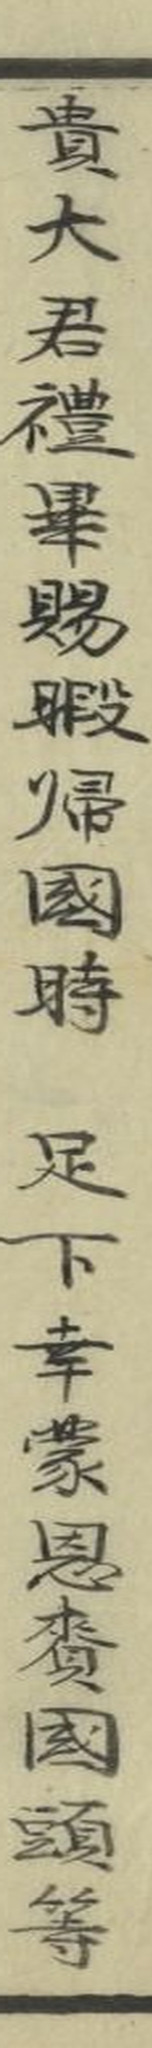貴大君礼畢賜暇帰国時足下幸蒙恩賓国頭等
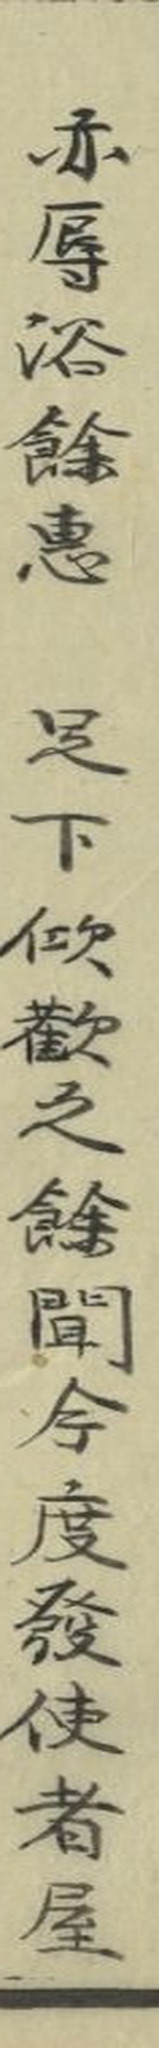亦辱浴余惠足下傾歓之余聞今度発使者屋
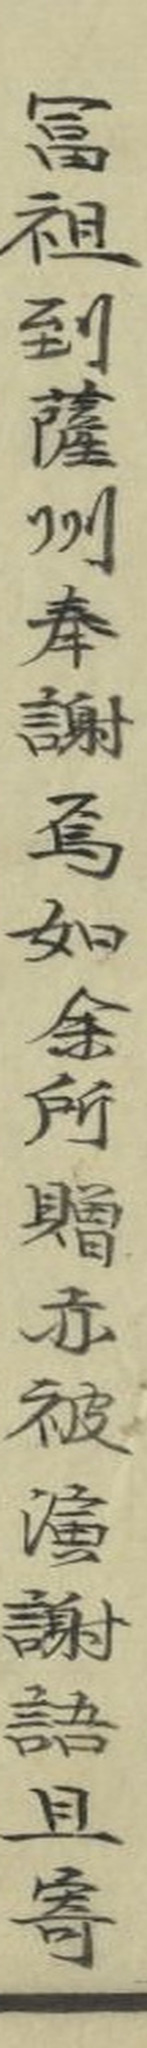富祖到薩州奉謝焉如余所贈亦被演謝語且寄
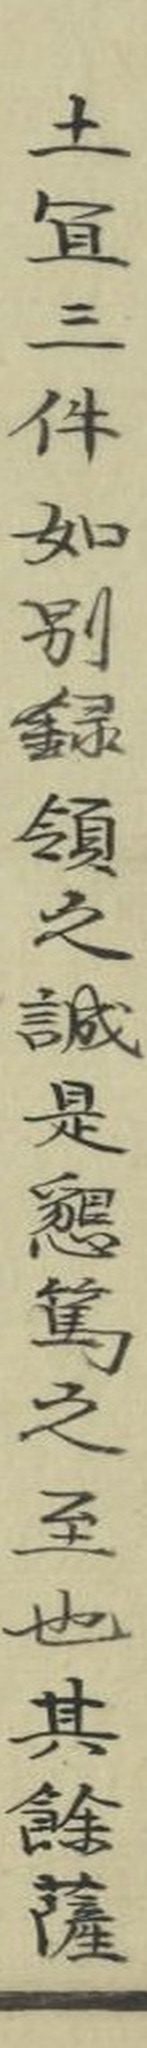土冝三件如別録領之誠是懇篤之至也其余薩
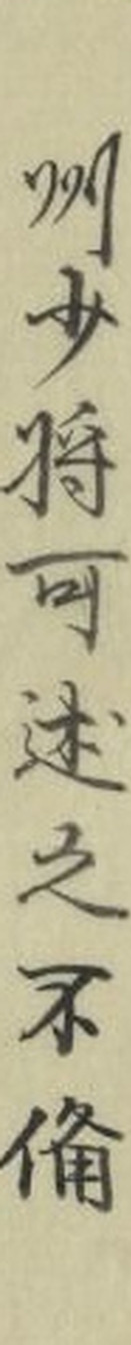州少将可述之不備
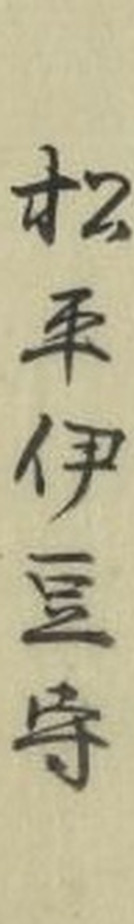松平伊豆守
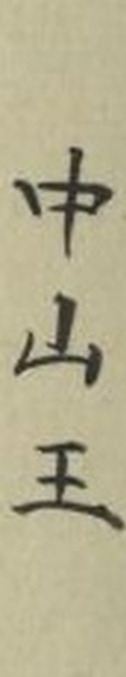中山王
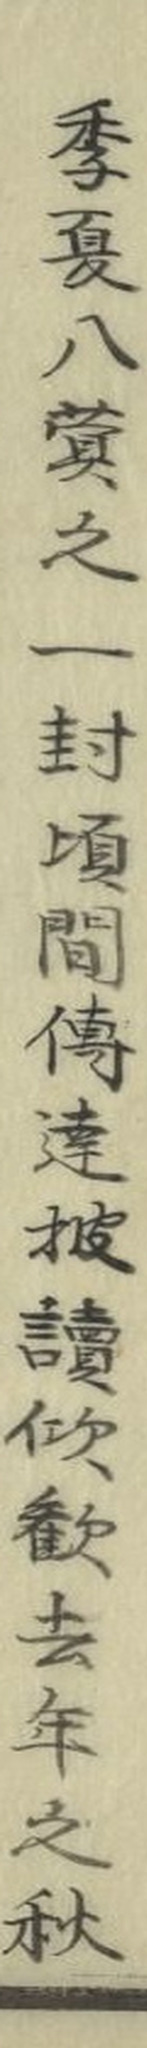季夏八蓂之一封頃間伝達披読傾勧去年之秋
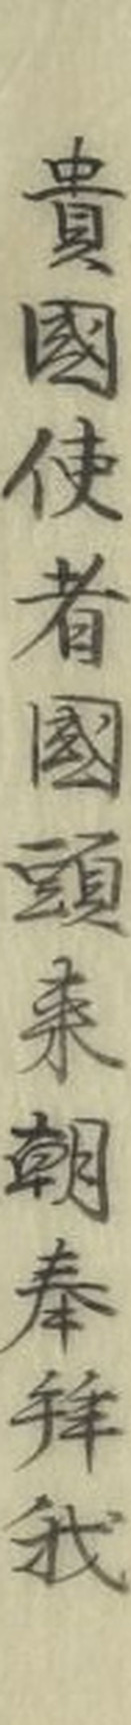貴国使者国頭来朝奉拝我
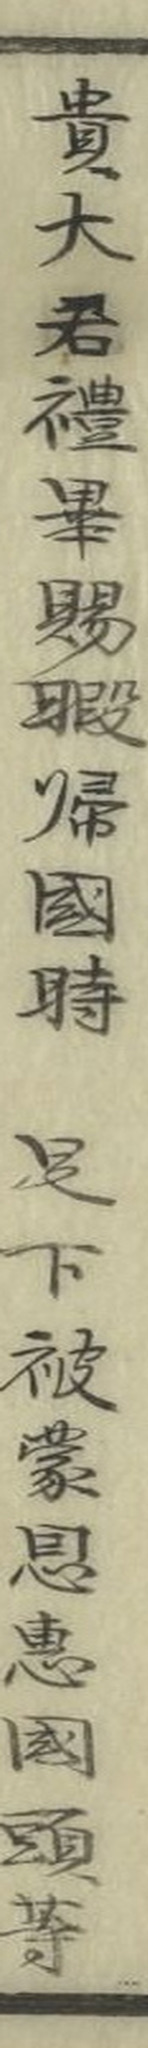貴大君礼畢賜暇帰国時足下被蒙恩恵国頭等
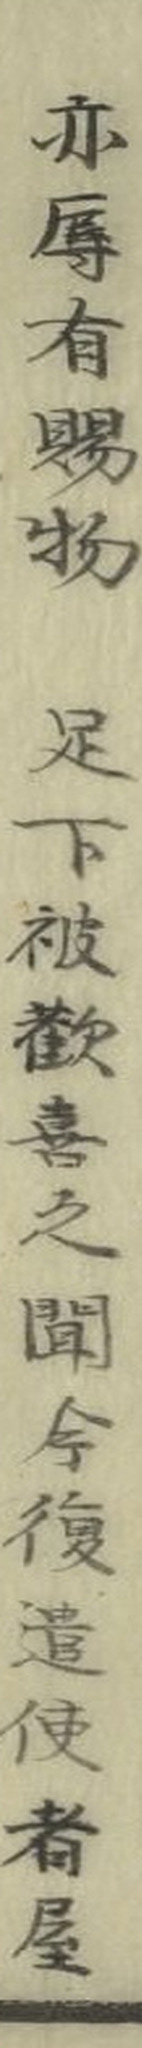亦辱有賜物足下被歓喜之聞今復遣使者屋
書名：琉球往来（上）
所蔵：University of the Ryukyus Library
